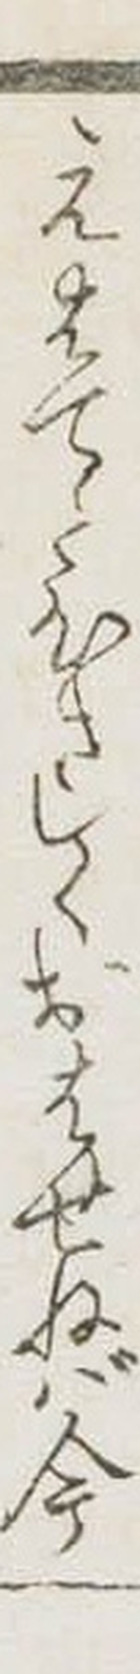えはてゝひさしくおはせねば今
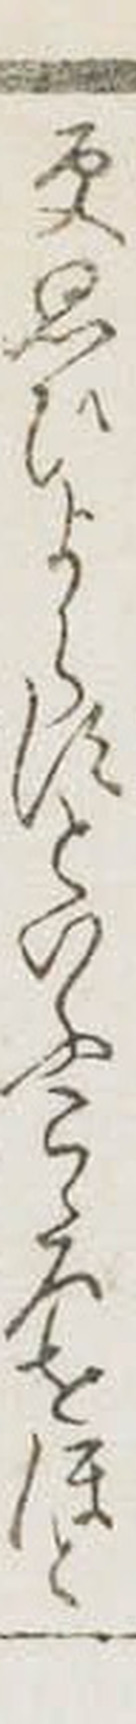更思ひよらずといふこゝろをほと
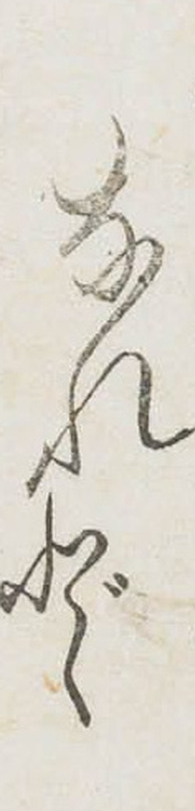なれど
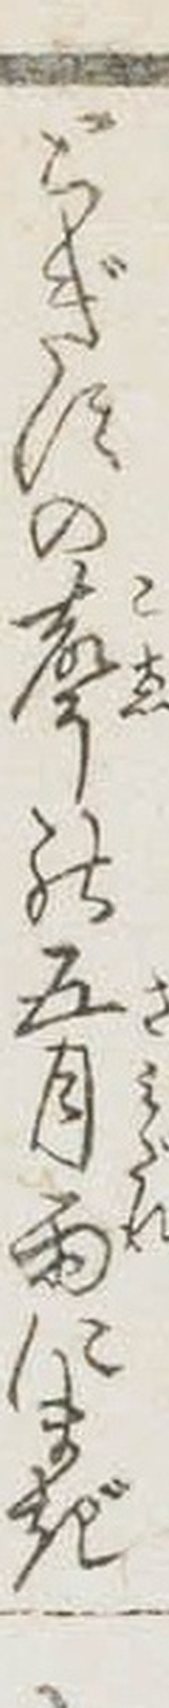とぎすの声の五月雨にまぎ
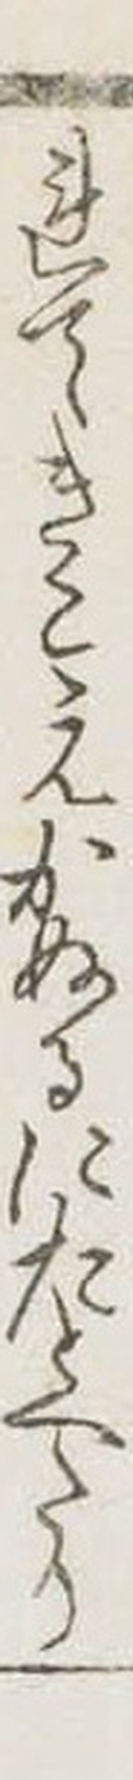れてきこえかぬるにたとへたり
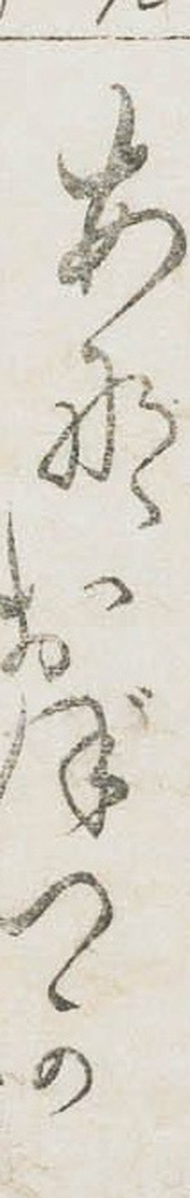あなおぼつか
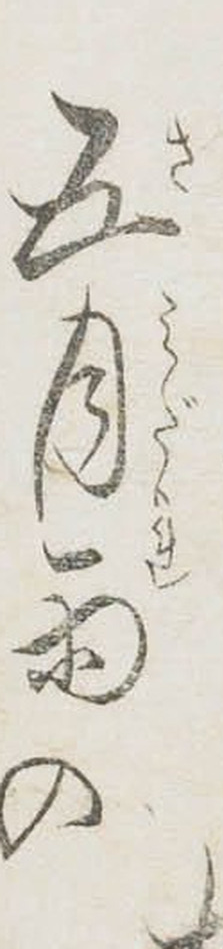五月雨の
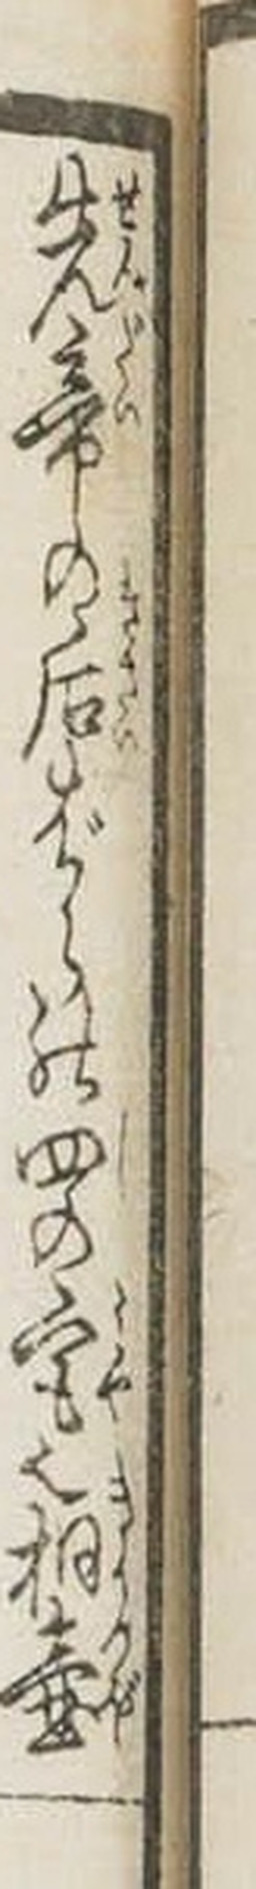先帝の后ばらの四の宮也桐壺
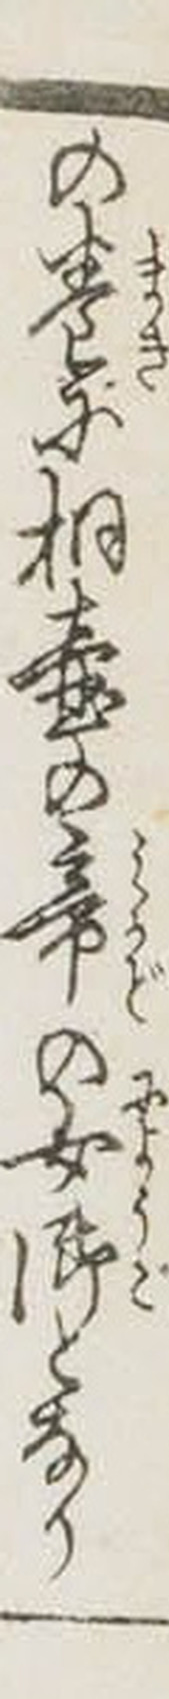の巻に桐壺の帝の女御となり
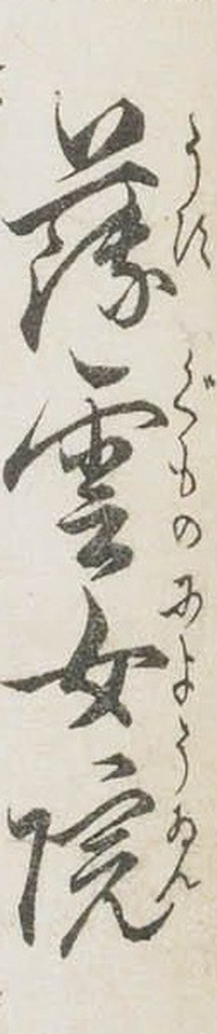薄雲女院
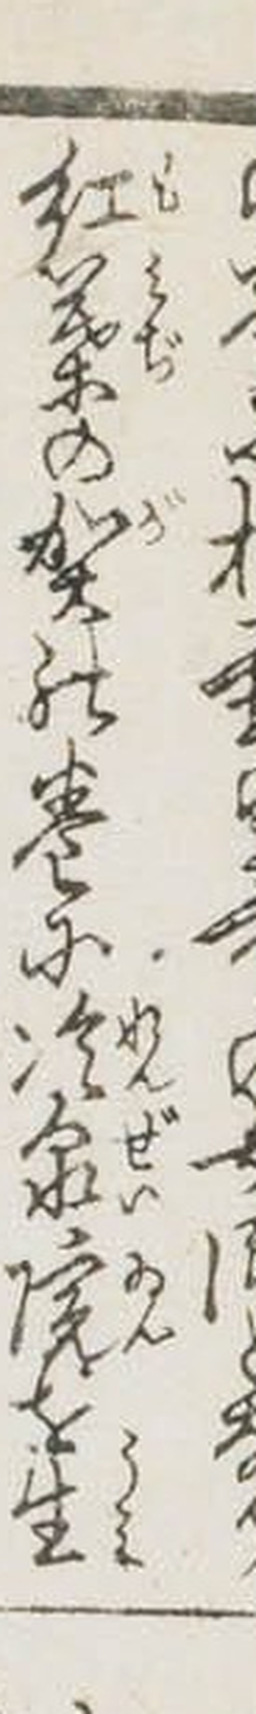紅葉の賀の巻に冷泉院を生
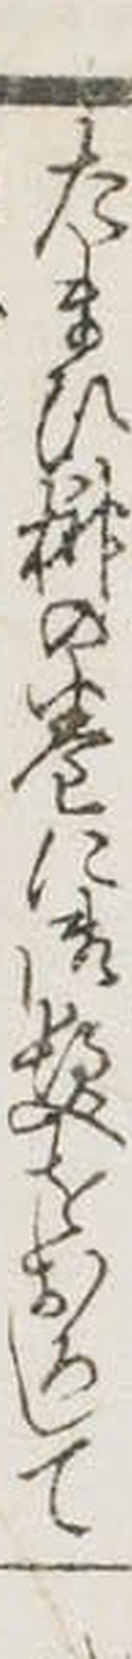たまひ榊の巻に御髪をおろして
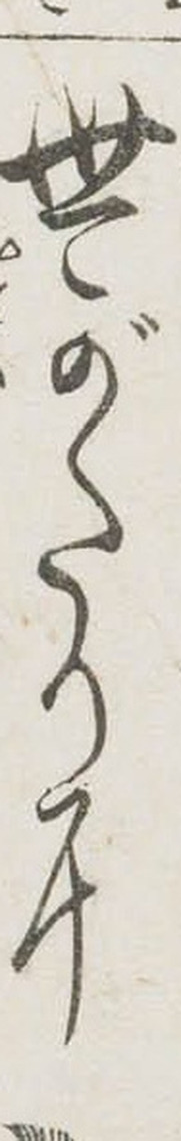世がたりに
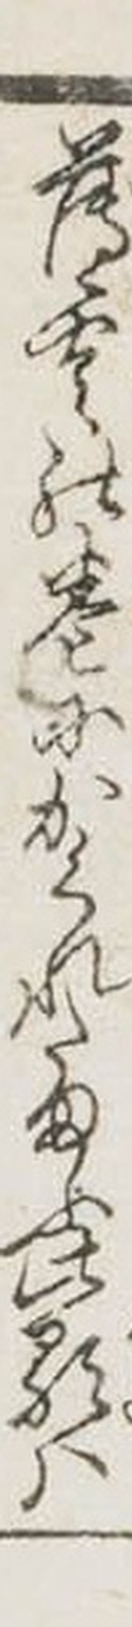薄雲の巻にかくれたまふ此歌は
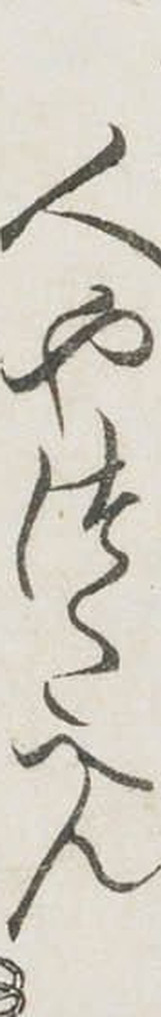人やつたへん
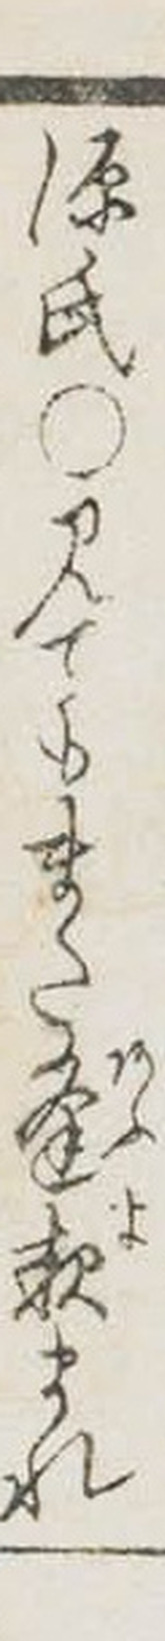源氏○見てもまた逢夜まれ
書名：源氏百人一首
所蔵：東京学芸大学教育コンテンツアーカイブ
